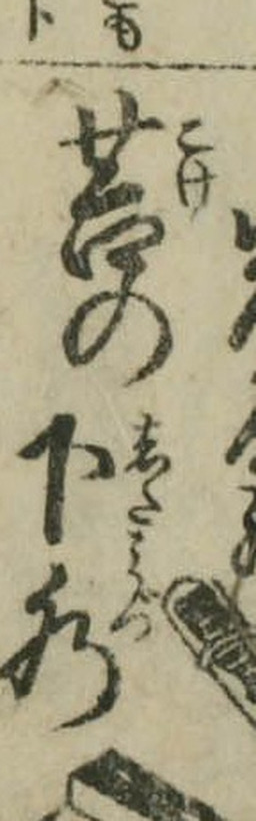苔の下水
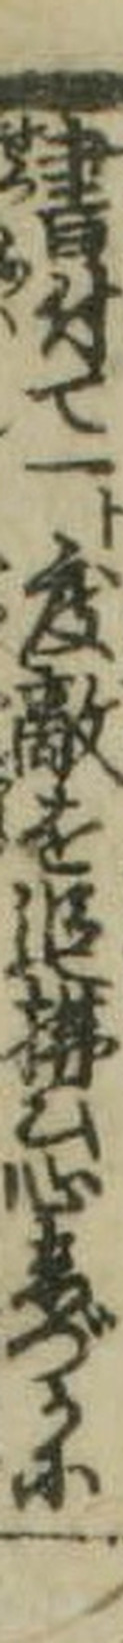書付て一ト度敵を追払ひ心しづかに
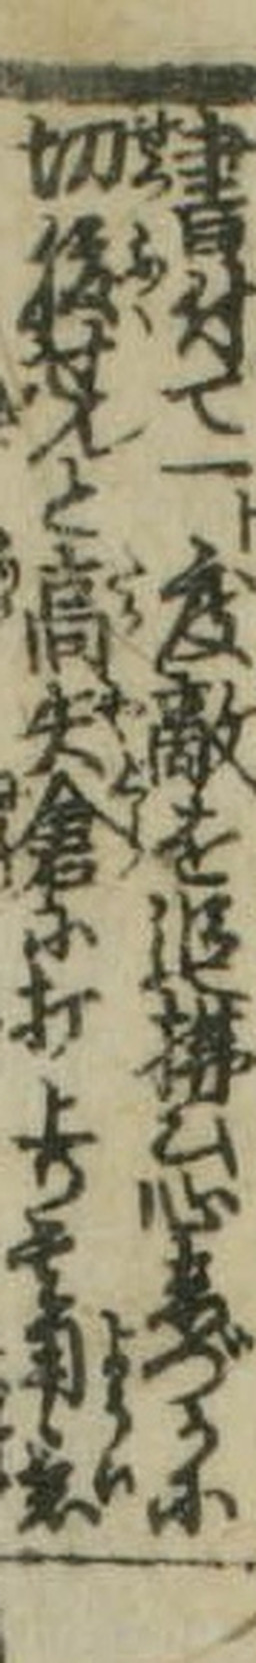切腹せんと高矢倉に打上り其用意
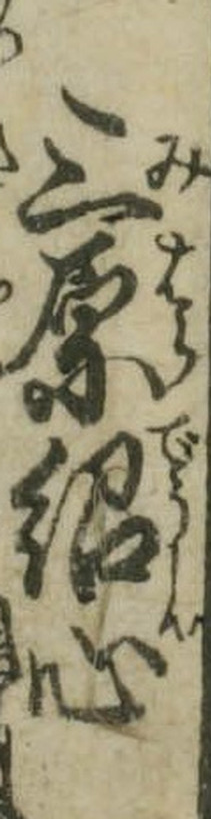三原紹心
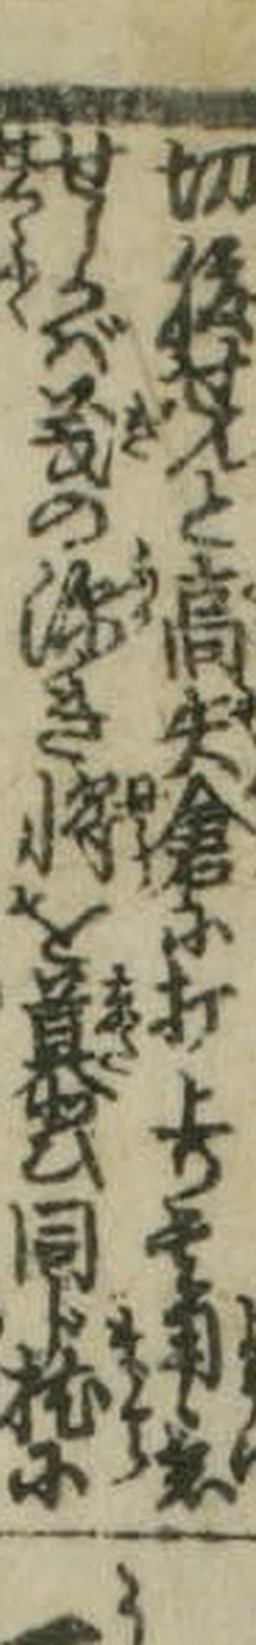せしかば義の深き将を慕ひ同じ枕に
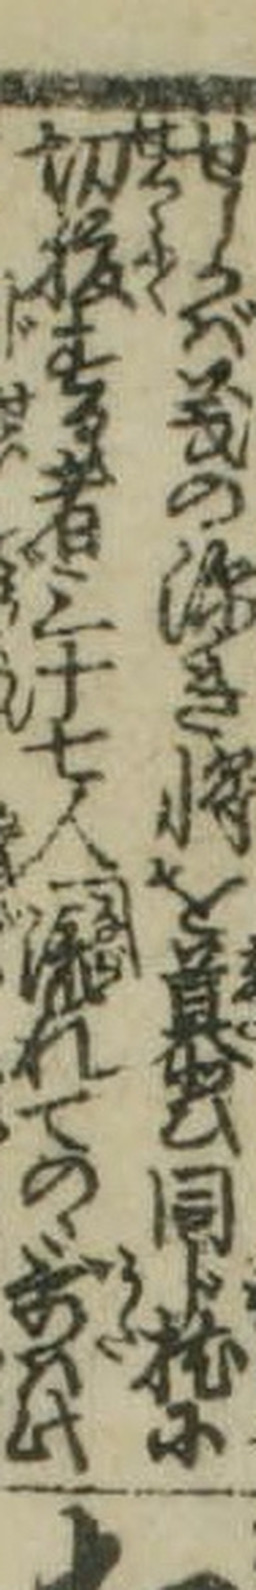切腹する者三十七人〽流れての哥は此
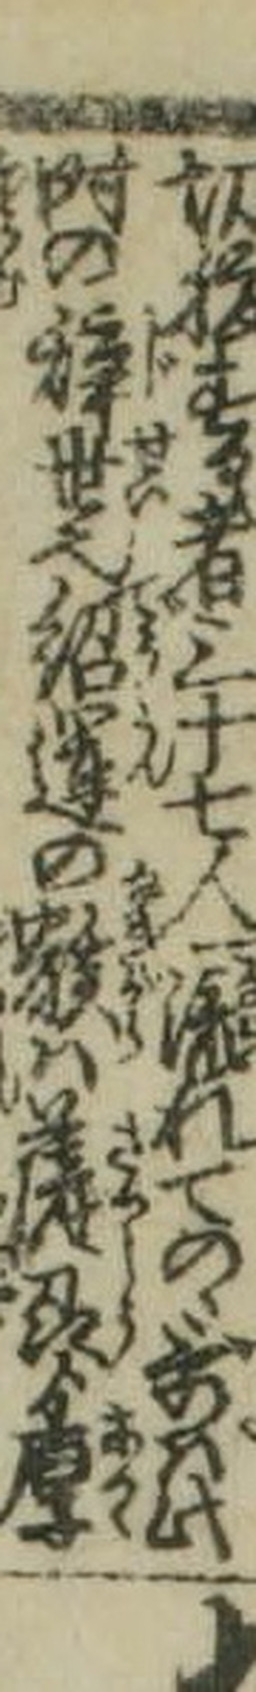時の辞世也紹運の骸は薩州ゟ厚
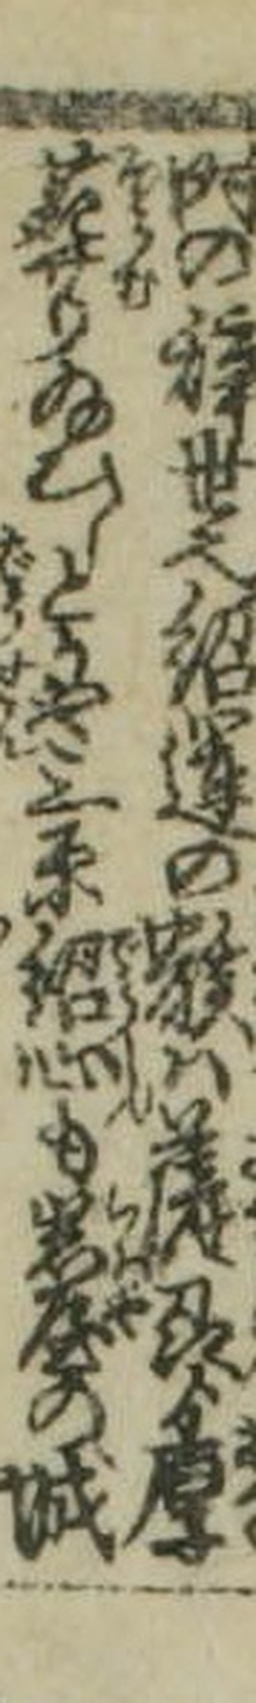葬り給ひしとかや三原紹心も岩屋の城
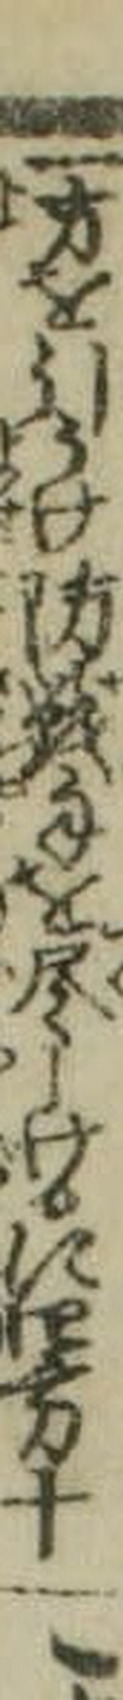一方を引うけ防戦手を尽しけるに四方十
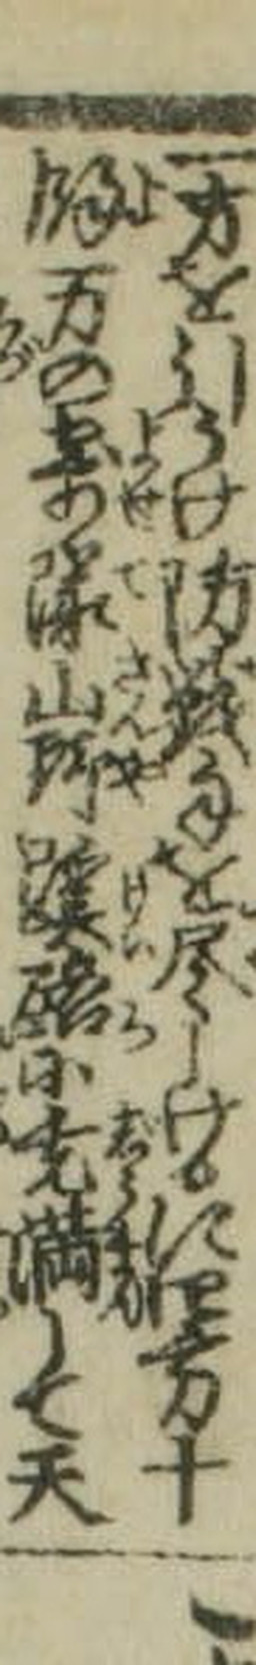余万の寄隊山野蹊路に充満して天
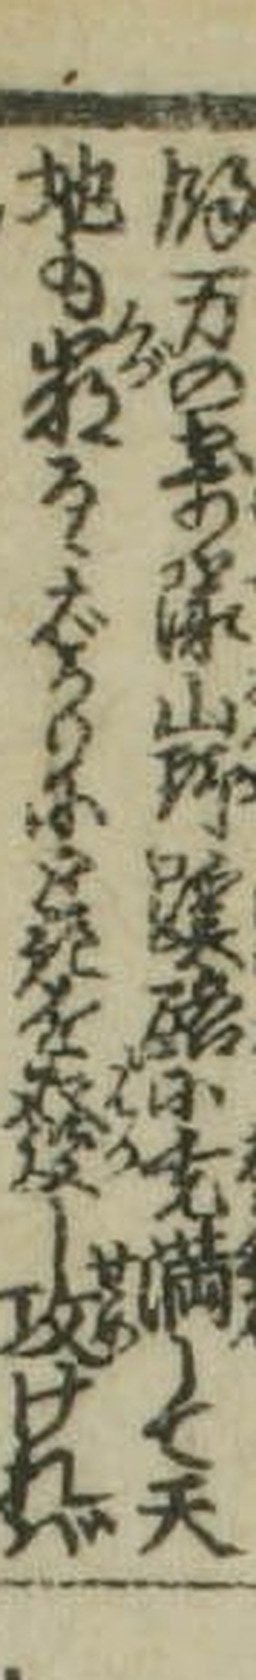地も崩るゝばかりにときを発し攻ければ
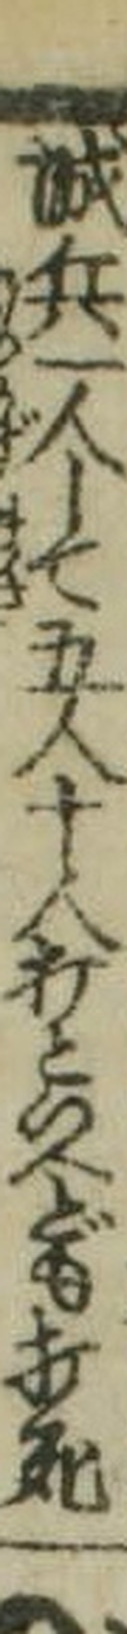城兵一人して五人十人打といへども打死
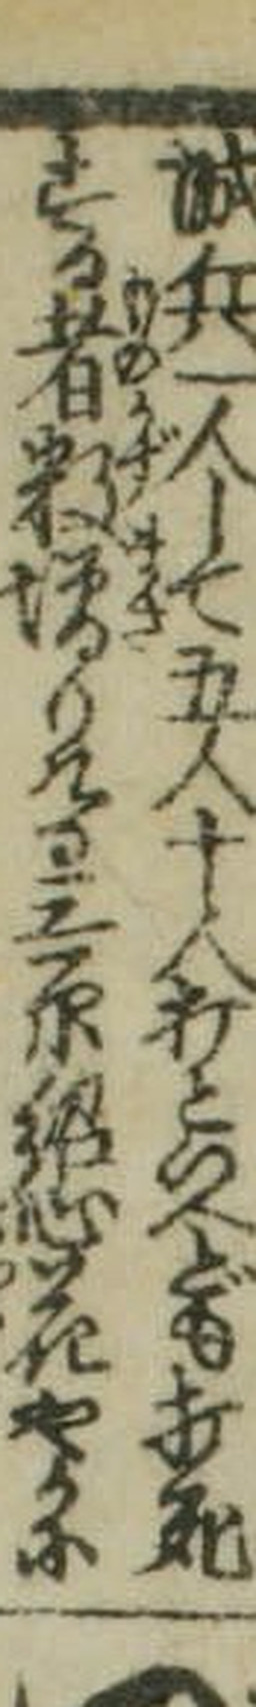する者数増りける三原紹心花やかに
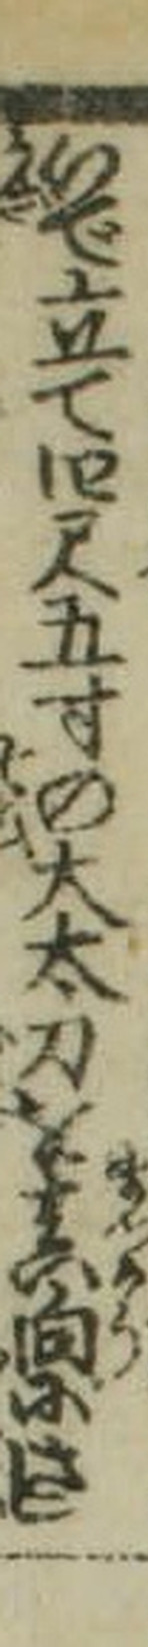いで立て四尺五寸の大太刀を真向にさし
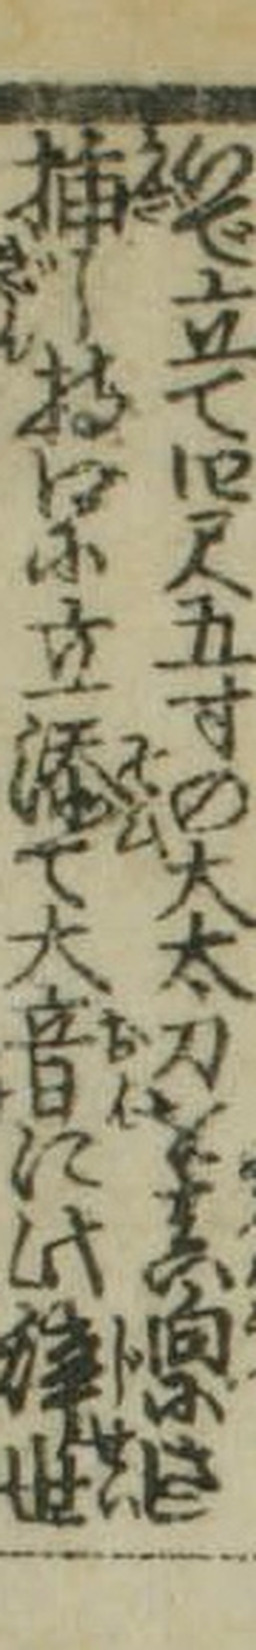挿し持口に立添て大音に此辞世
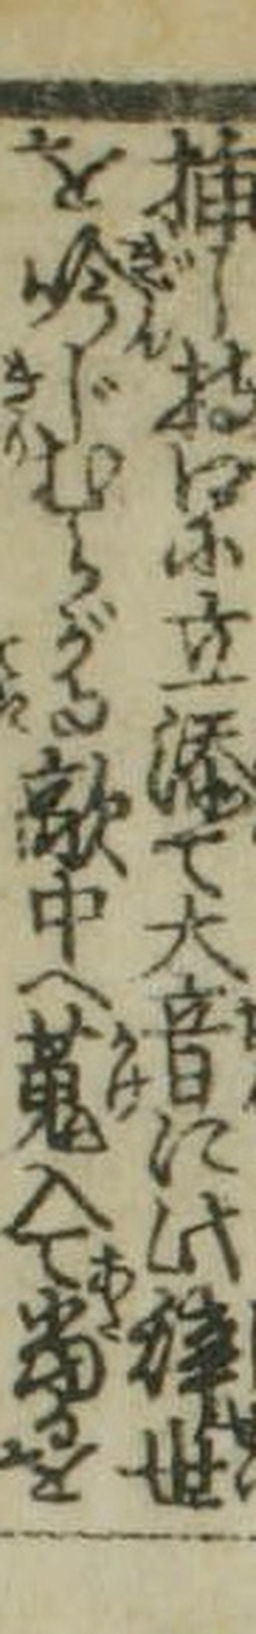を吟じむらがる敵中へ蒐入て当るを
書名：續英雄百人一首
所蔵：東京学芸大学附属図書館
